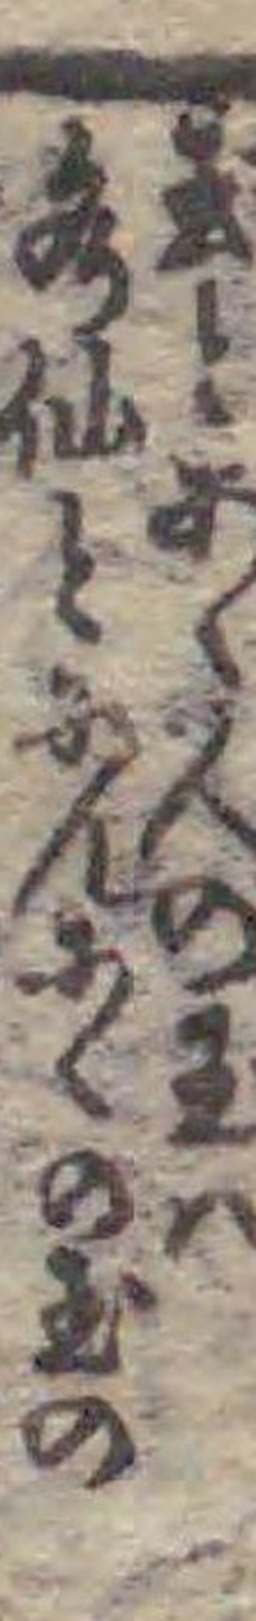水仙とにんにくの玉の
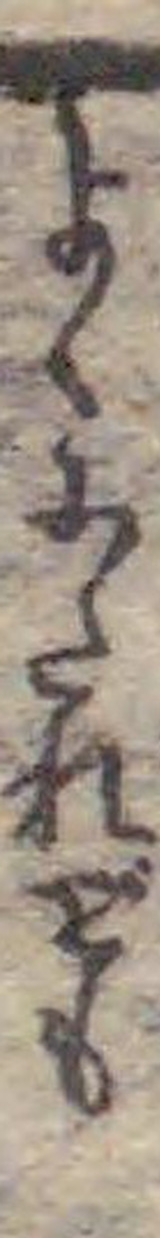よくにたれども
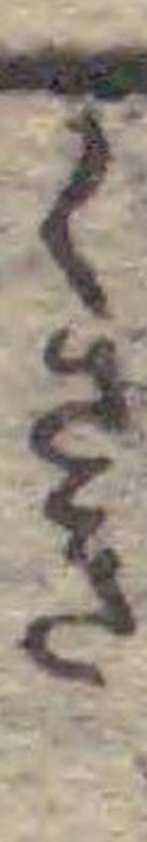くさき
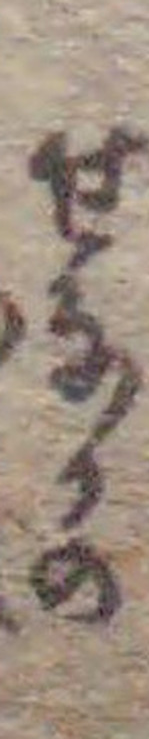せなかの
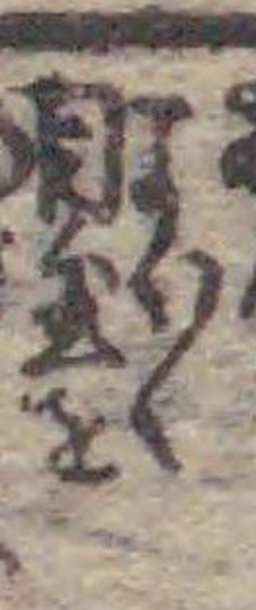目玉を
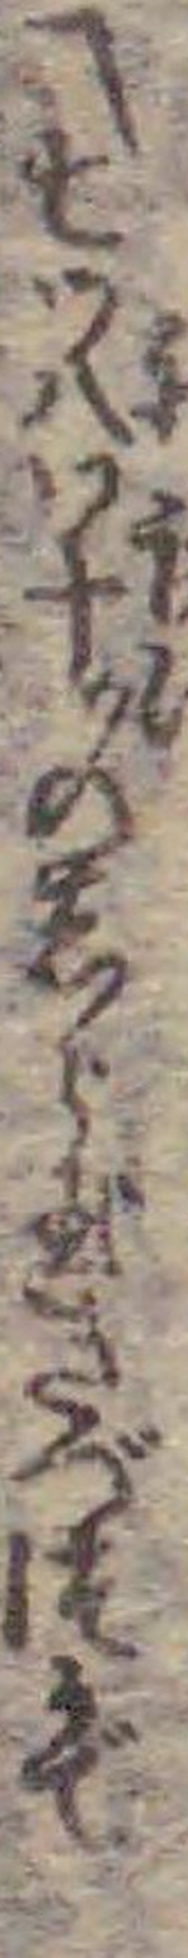〽七つ八つ十ぅのしら玉きづつかで
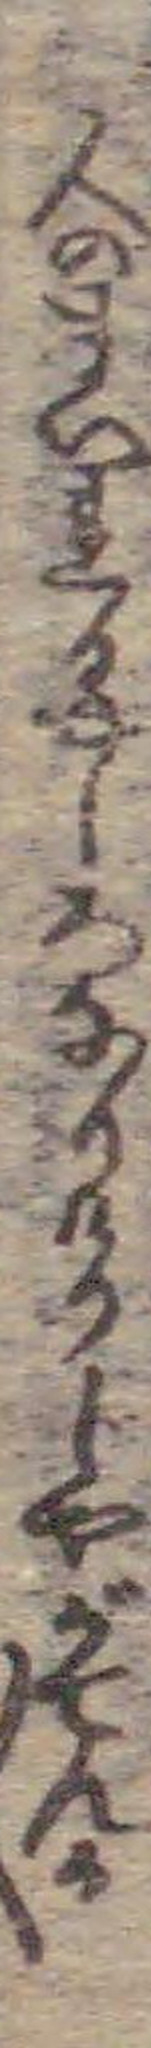人のまいれるやしろなりけりじやがてんか

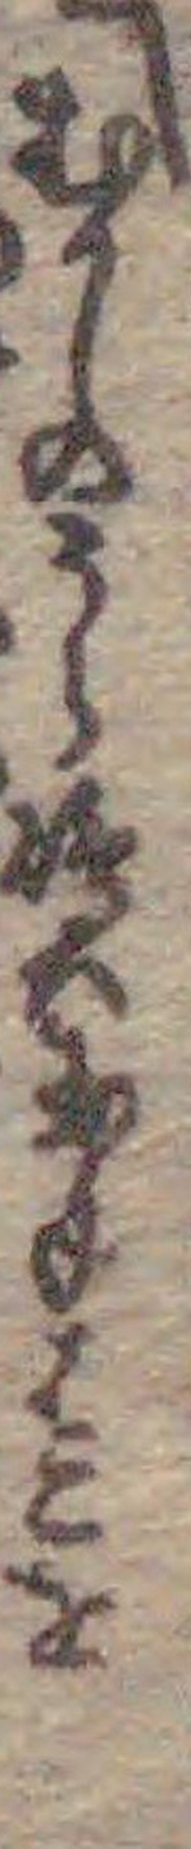〽むかしのうら島は玉手はこを
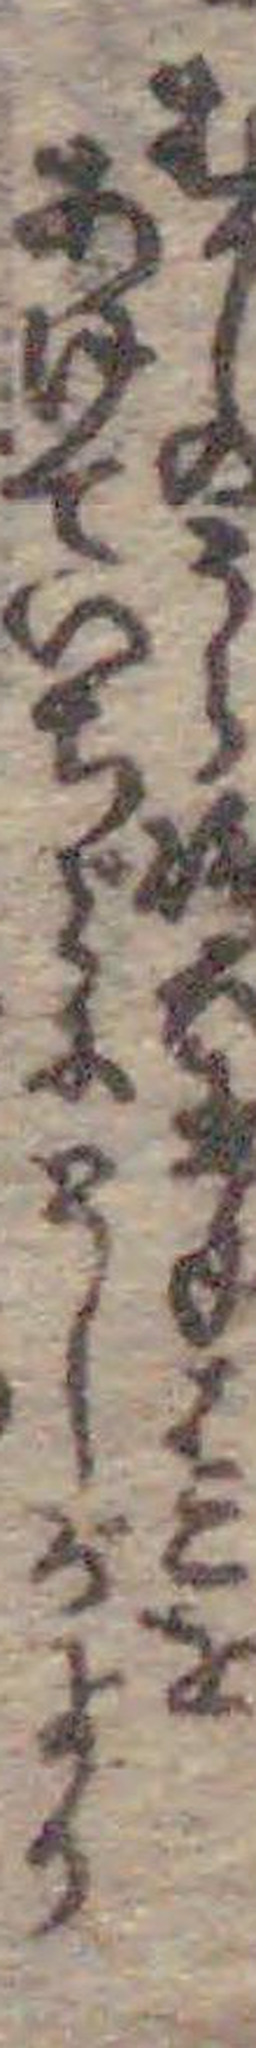あけていちどにとしがより
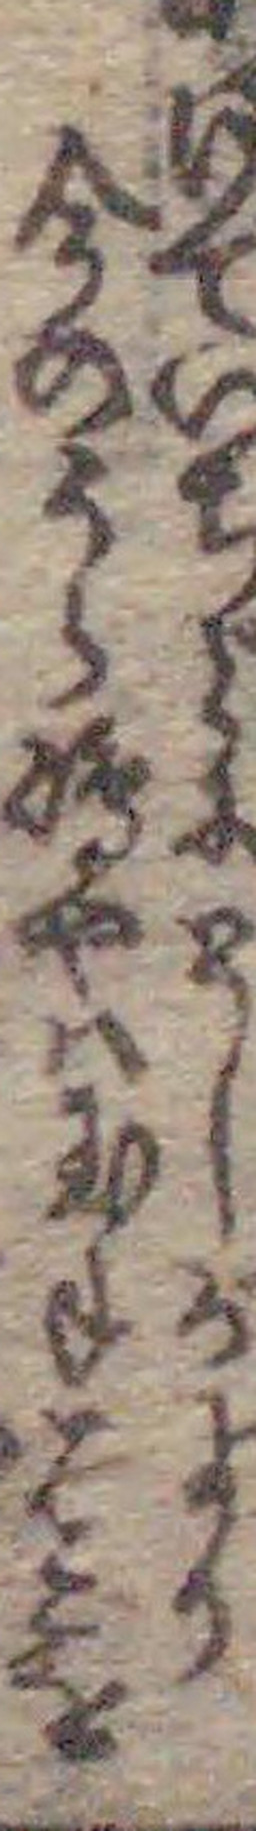今のうら島やは玉手はこを
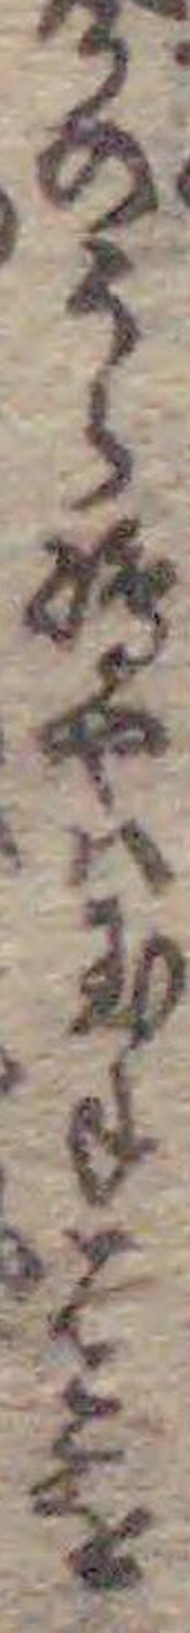今のうら島やは玉手はこを
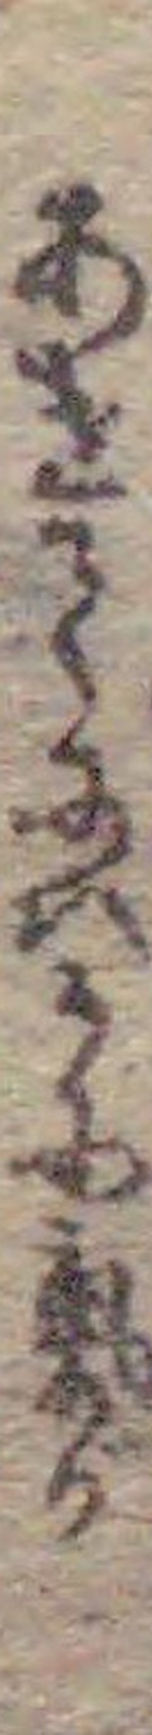あけてにはかに気が
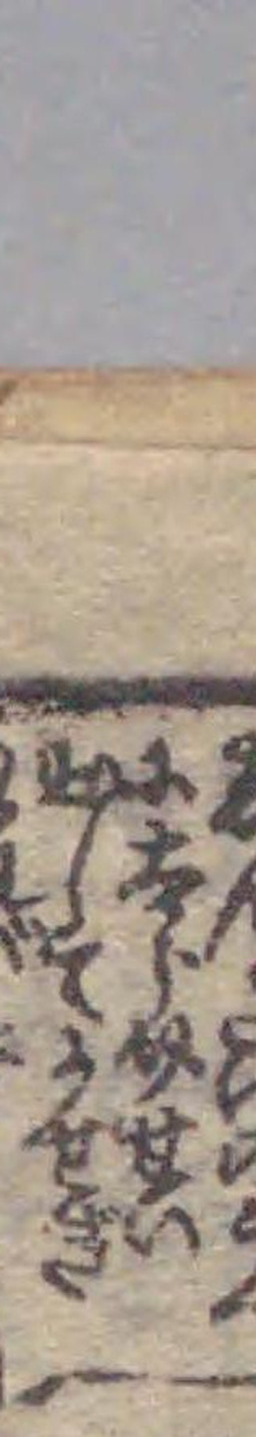出してかせぎ
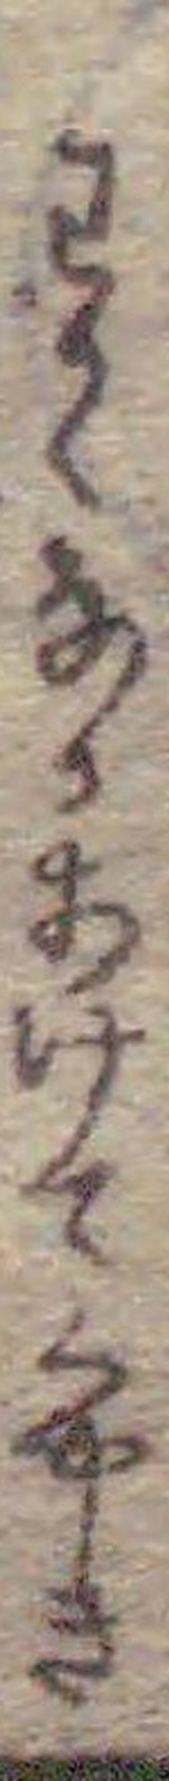わかくなるあけてくやしき
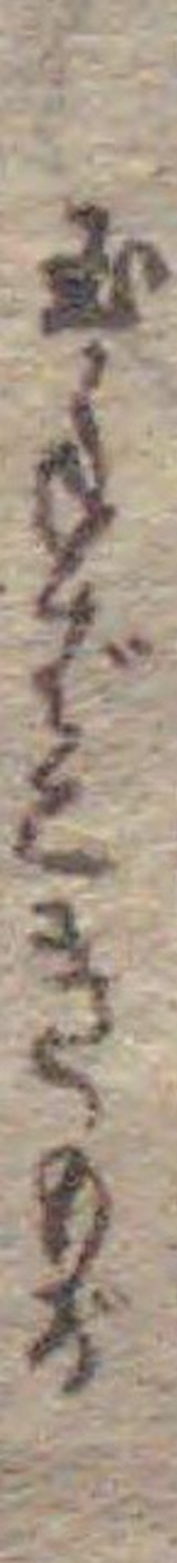玉手ばこきもが
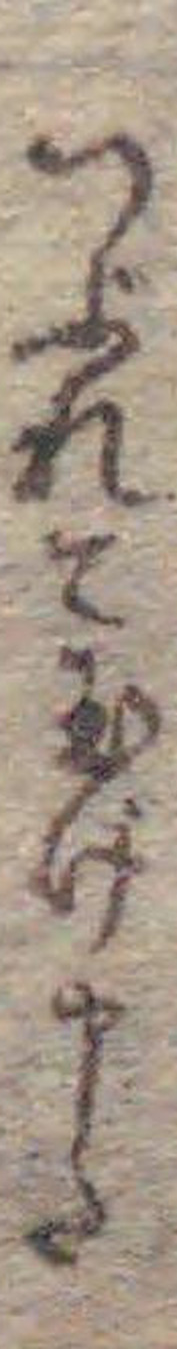つぶれて玉げ申た
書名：四遍搨心学草帋 : 3巻
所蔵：国立国会図書館 National Diet Library, JAPAN
